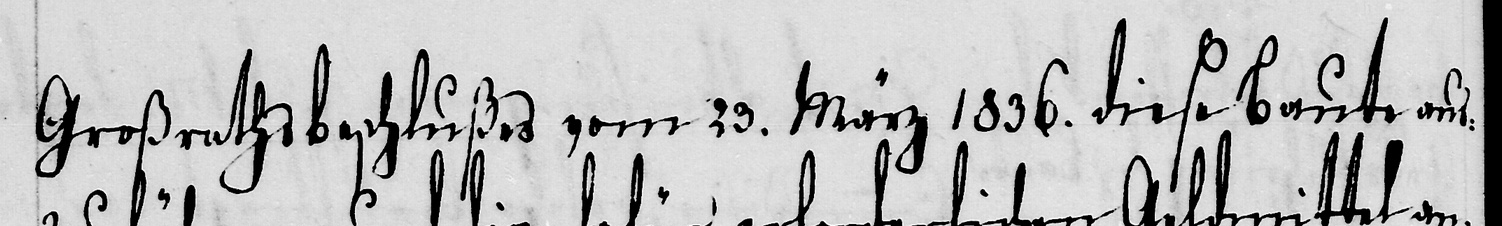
Großrathsbeschlußes vom 23. März 1836. diese Baute aus¬
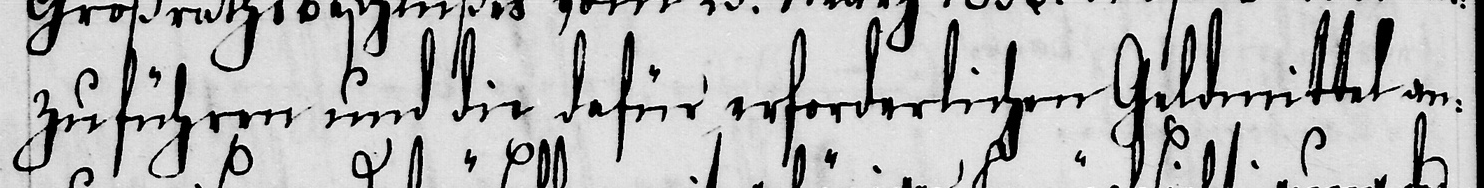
zuführen und die dafür erforderlichen Geldmittel a¬
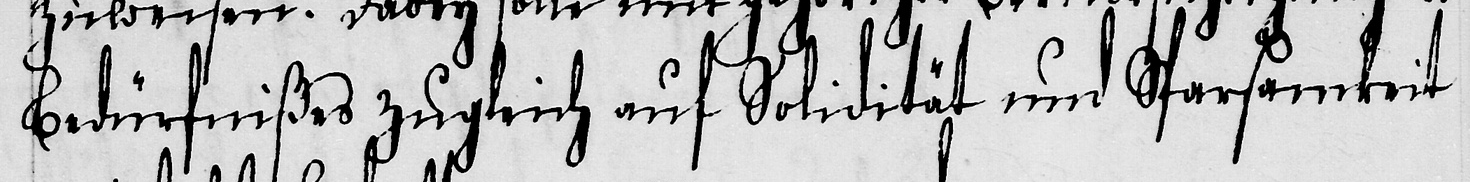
Bedürfnißes zugleich auf Solidität und Sparsamkeit
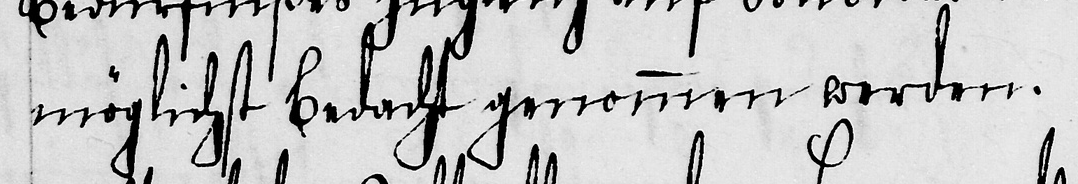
möglichst bedacht genommen werden.
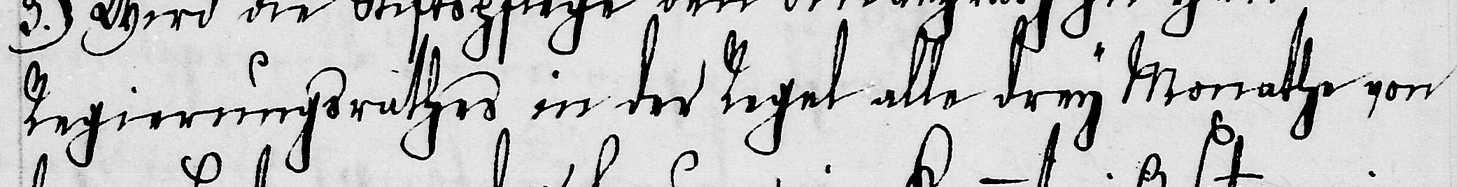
Regierungsrathes in der Regel alle drey Monathe von
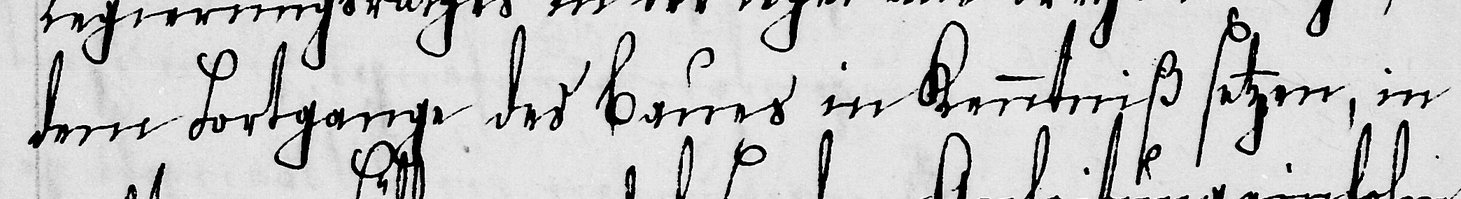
dem Fortgange des Baues in Kenntniß setzen, in
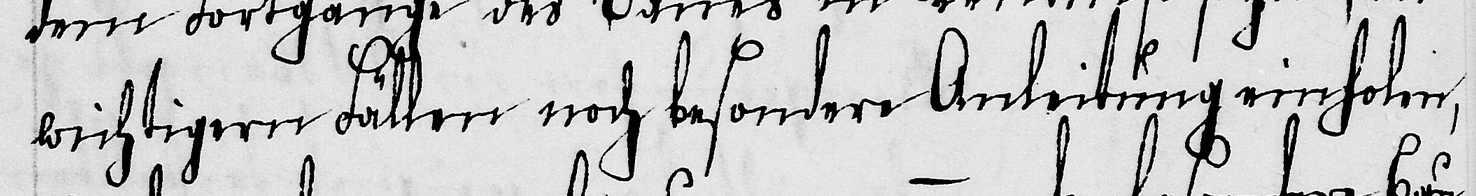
wichtigern Fällen noch besondere Anleitung einholen,
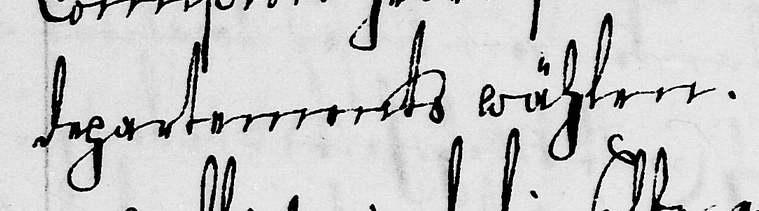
departements wählen.
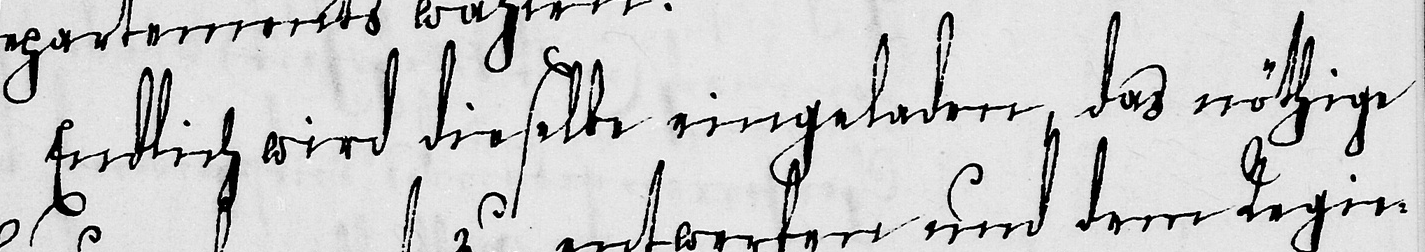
Endlich wird dieselbe eingeladen, das nöthige
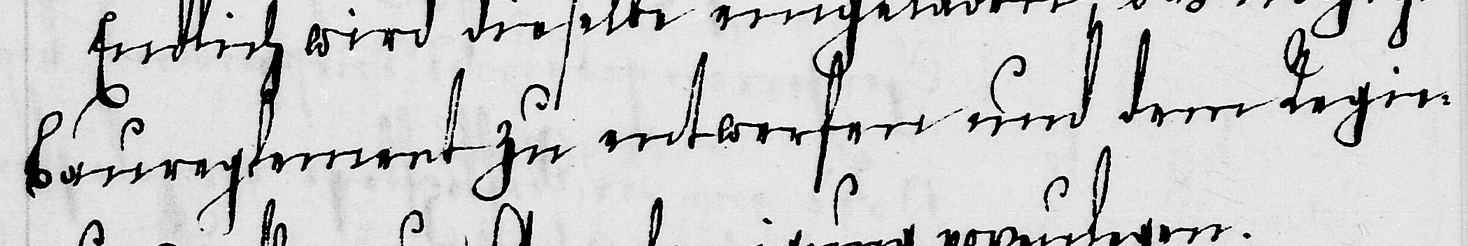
Baureglement zu entwerfen und dem Regie¬
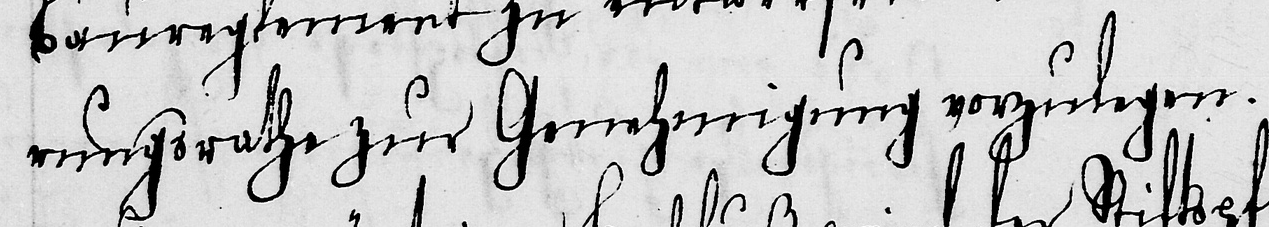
rungsrathe zur Genehmigung vorzulegen.
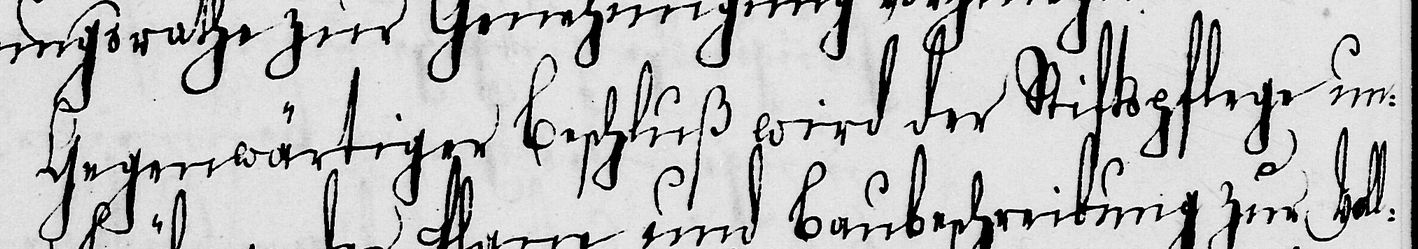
Gegenwärtiger Beschluß wird der Stiftspflege un¬
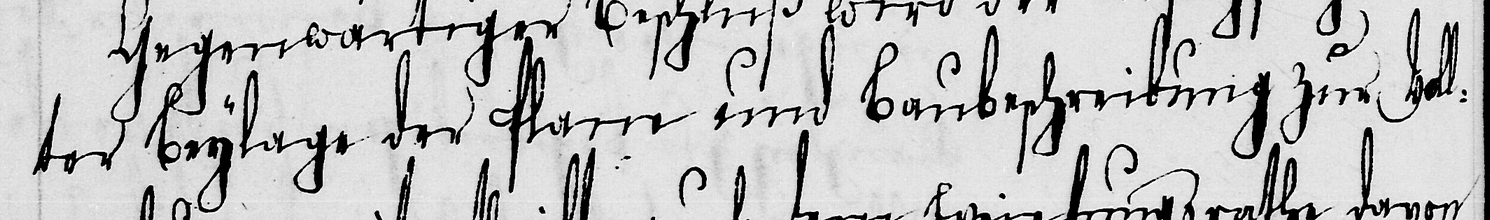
ter Beylage der Plane und Baubeschreibung zur Vol¬
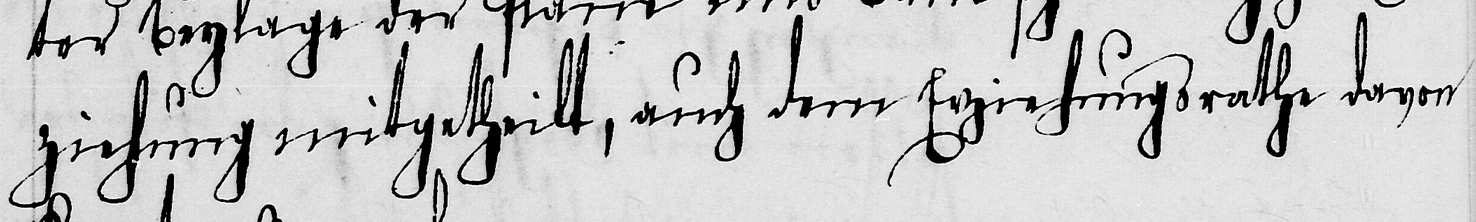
lziehung mitgetheilt, auch dem Erziehungsrathe davon
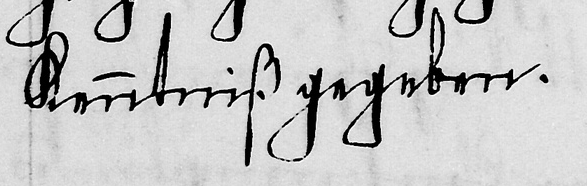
Kenntniß gegeben.
